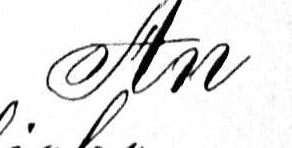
An
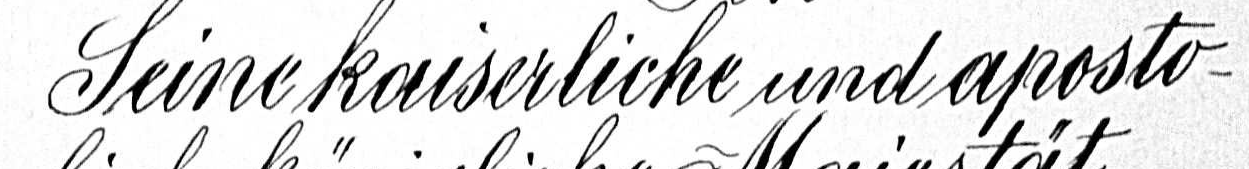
seine kaiserliche und aposto¬
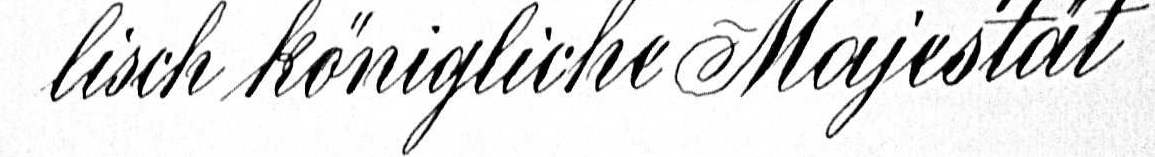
lisch königliche Majestät
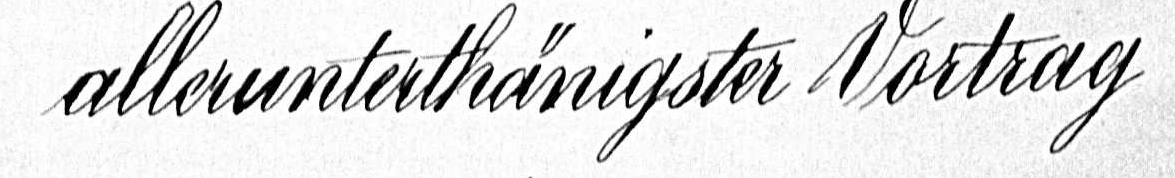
Allerunterthänigster Vortrag
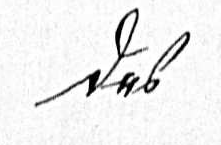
Des
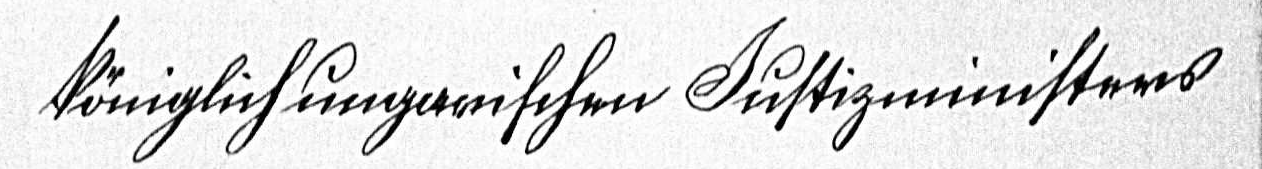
Königlich ungarischen Justizministers
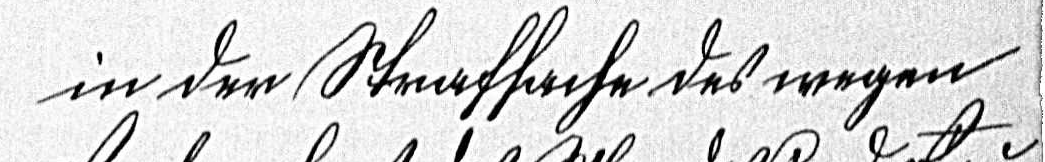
In der Strafsache des wegen
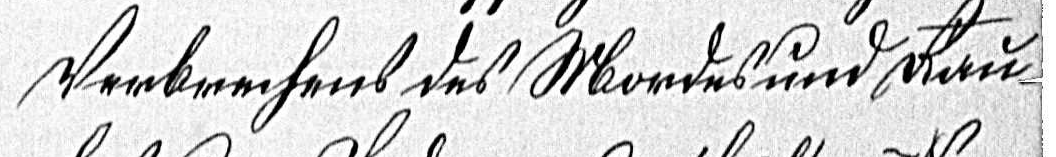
Verbrechens des Mordes und Rau¬
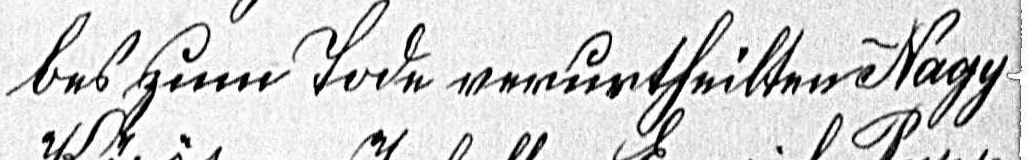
bes zum Tode verurtheilten Nagy¬
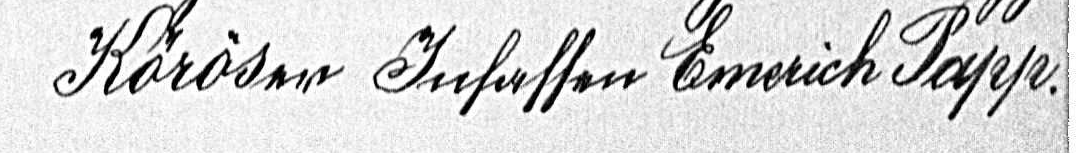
Kőröser Insassen Emerich Papp.
